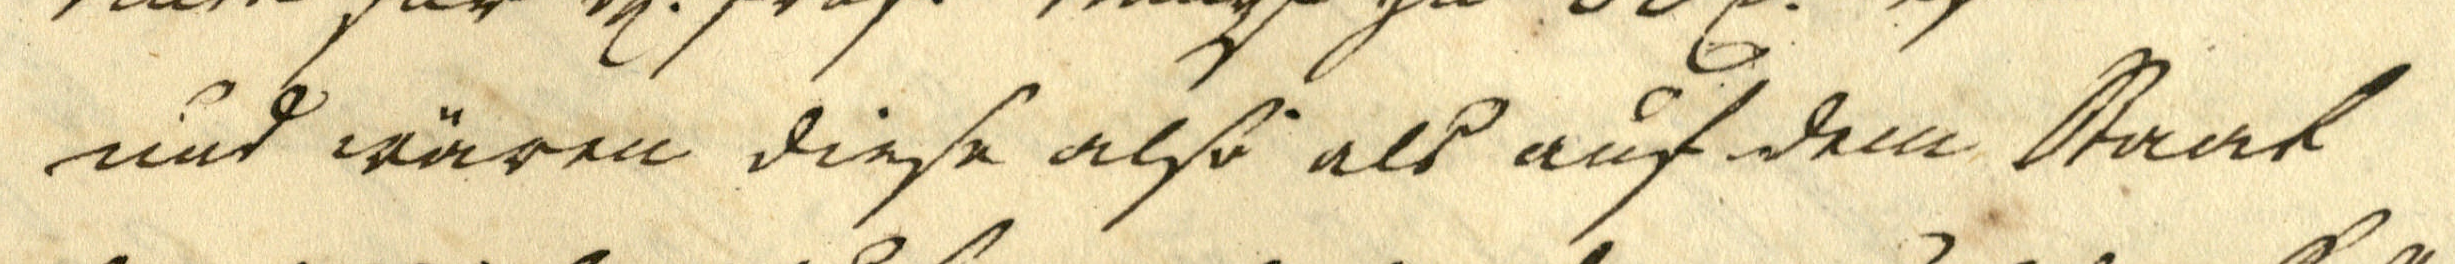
und wären diese also als auf dem Staat
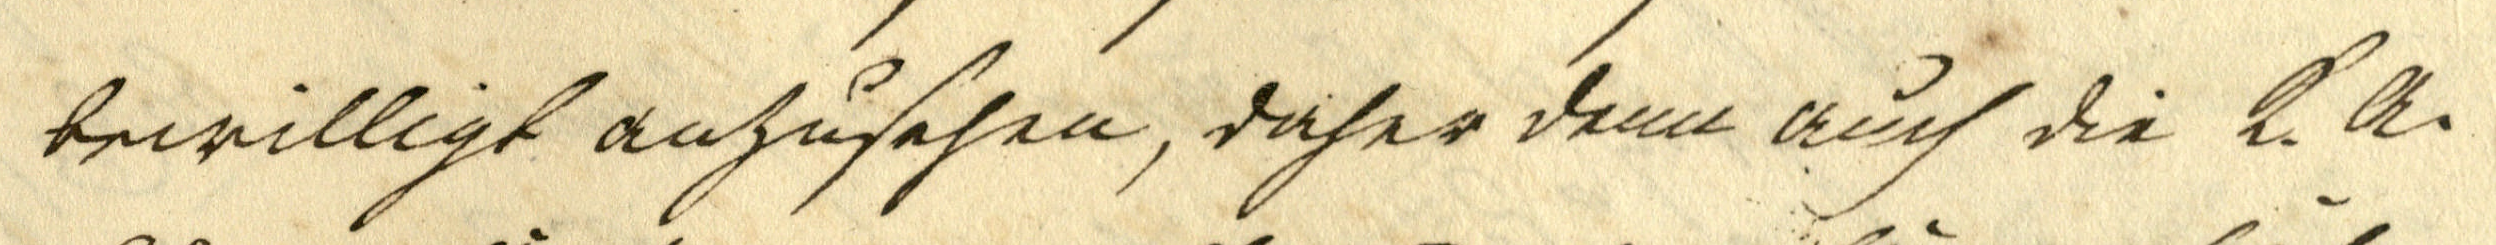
bewilligt anzusehen, daher denn auch die K. A.
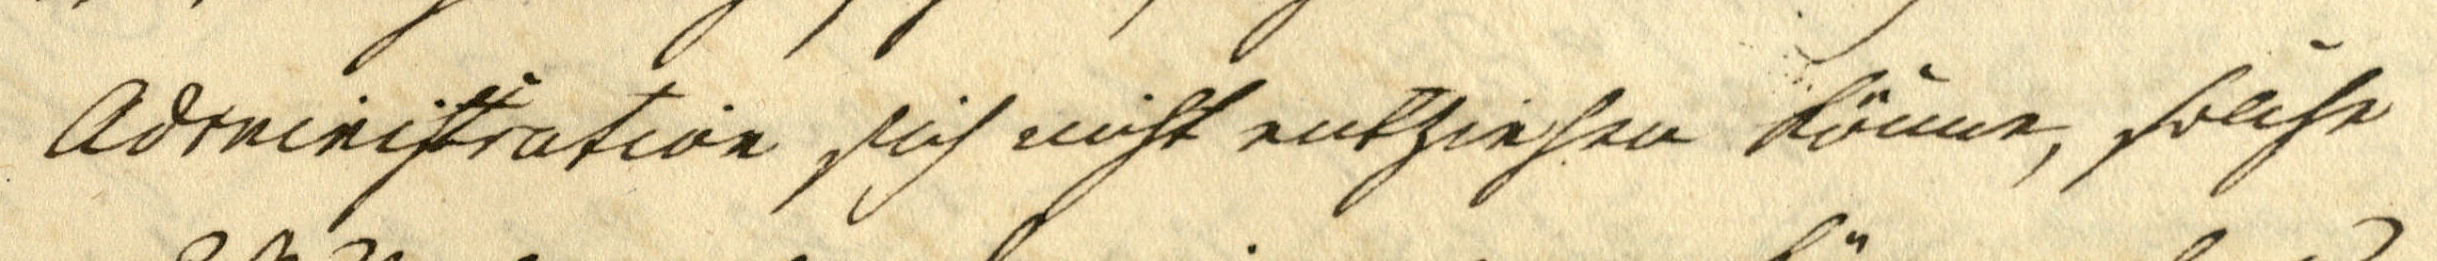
Administration sich nicht entziehen könne, solche
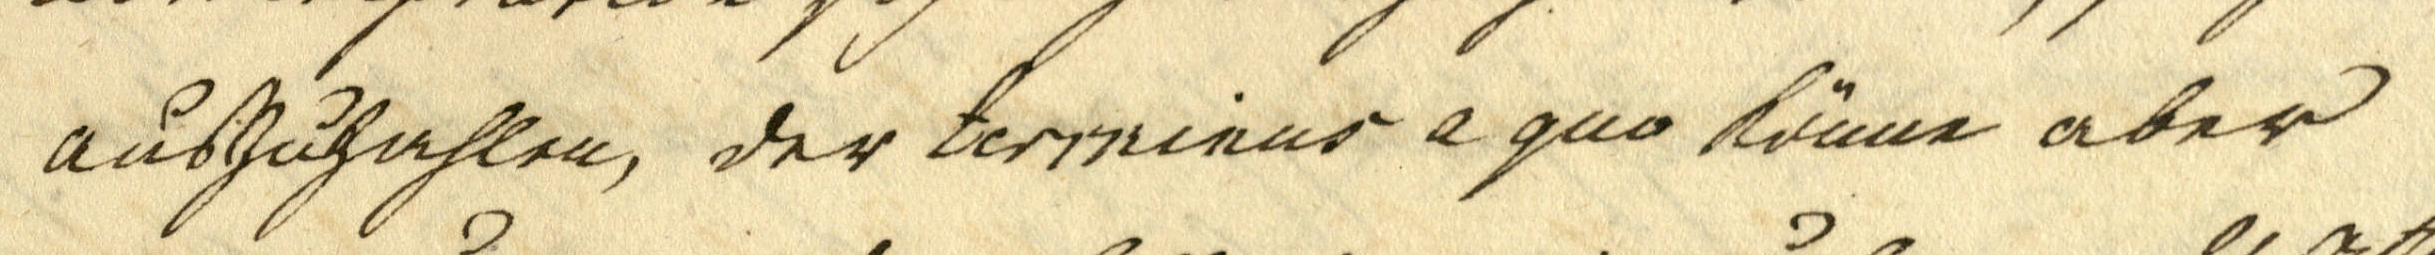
auszuzahlen, der terminus a quo könne aber
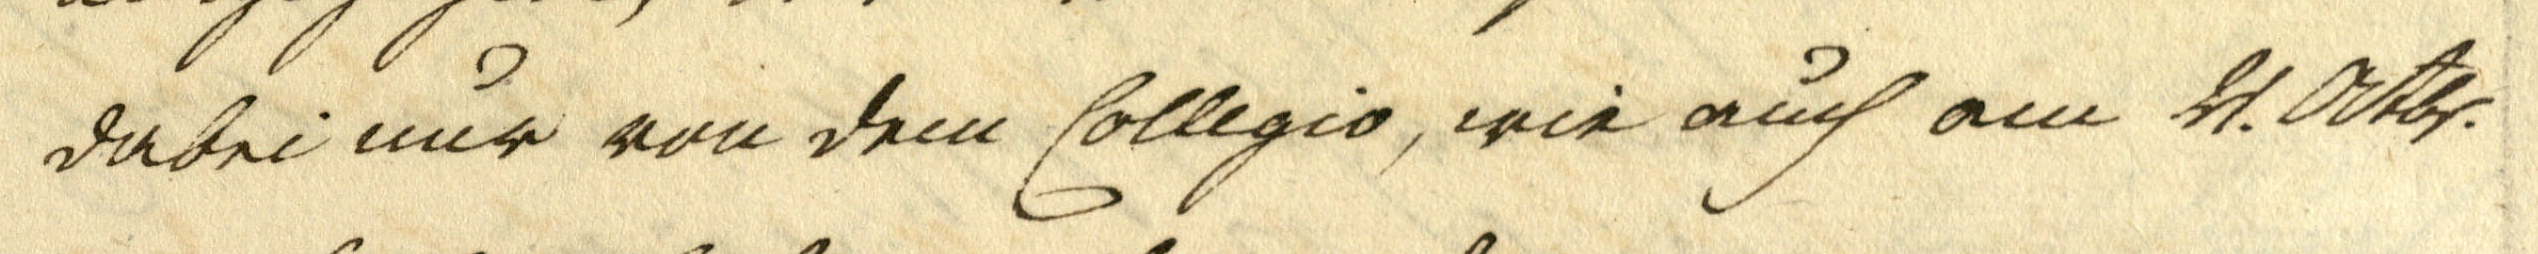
dabei nur von dem Collegio, wie auch am 21. Octbr.
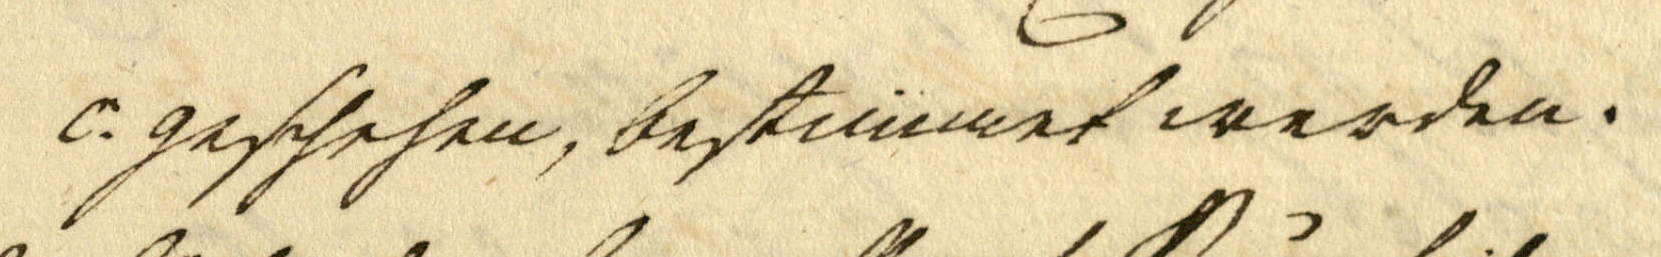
c. geschehen, bestimmet werden.
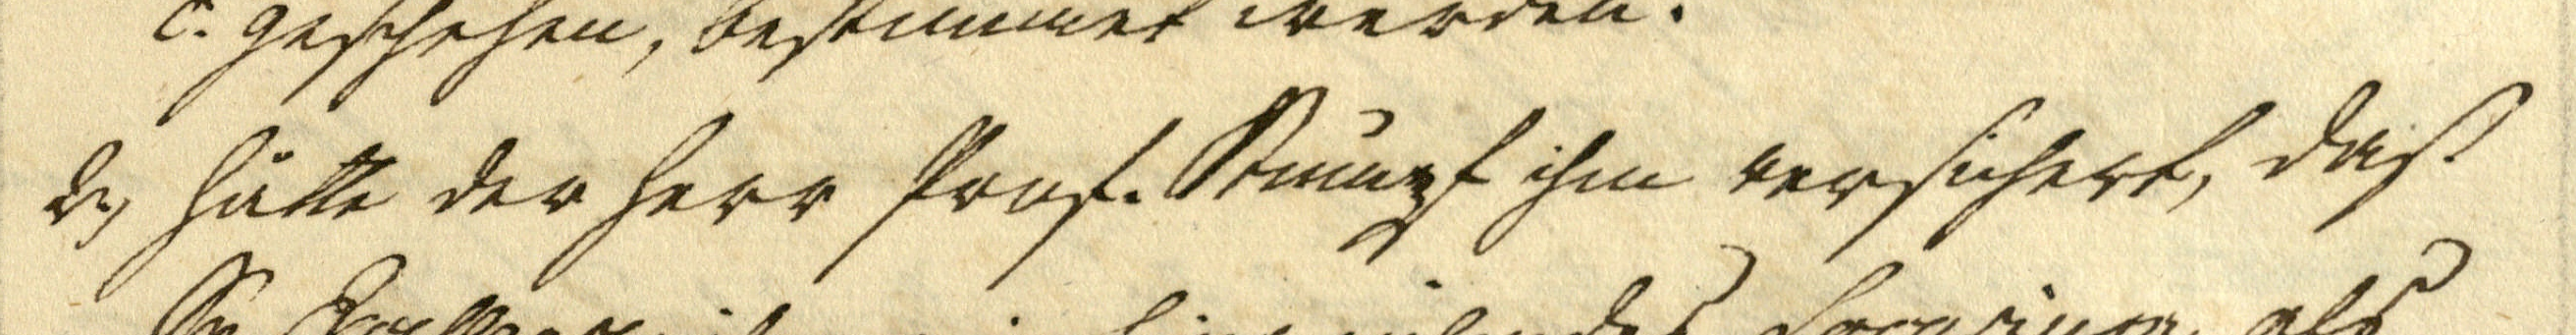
2., Hätte der Herr Prof. Stumpf ihm versichert, daß
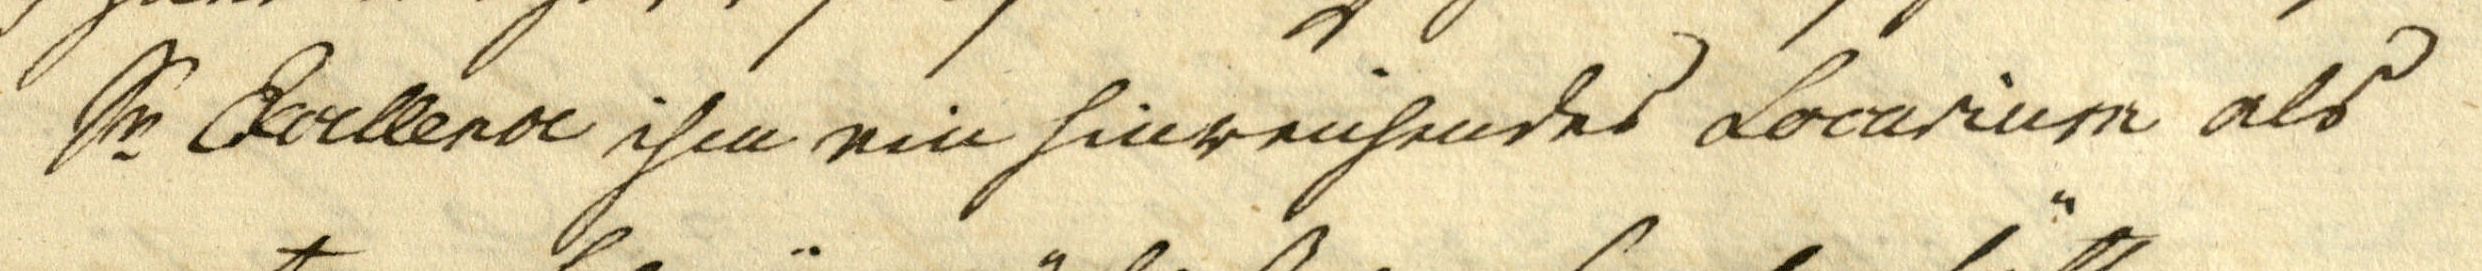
Sr Excellence ihm ein hinreichendes Locarium als
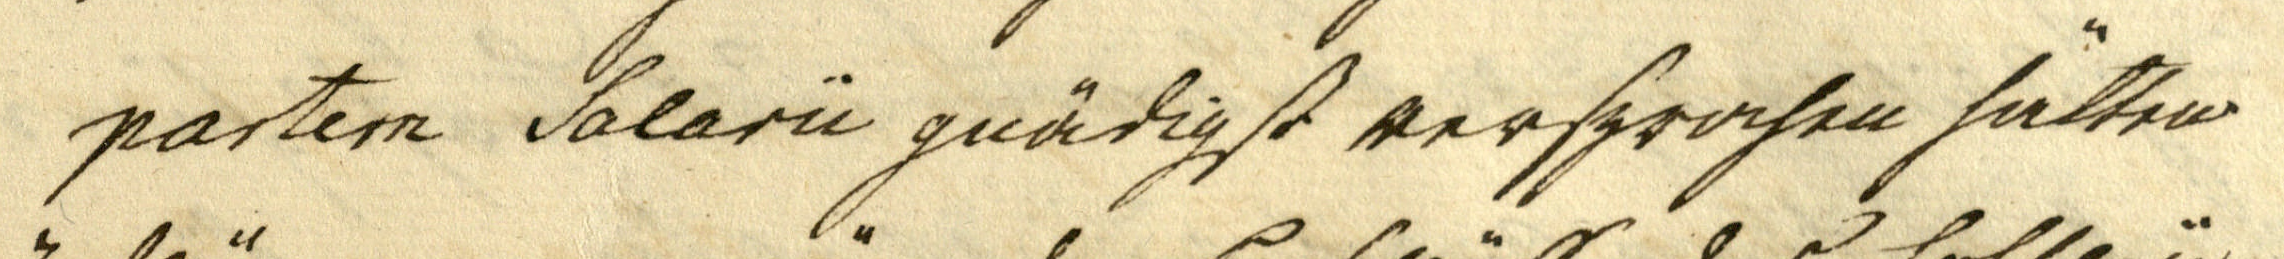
partem Salarii gnädigst versprochen hätten.
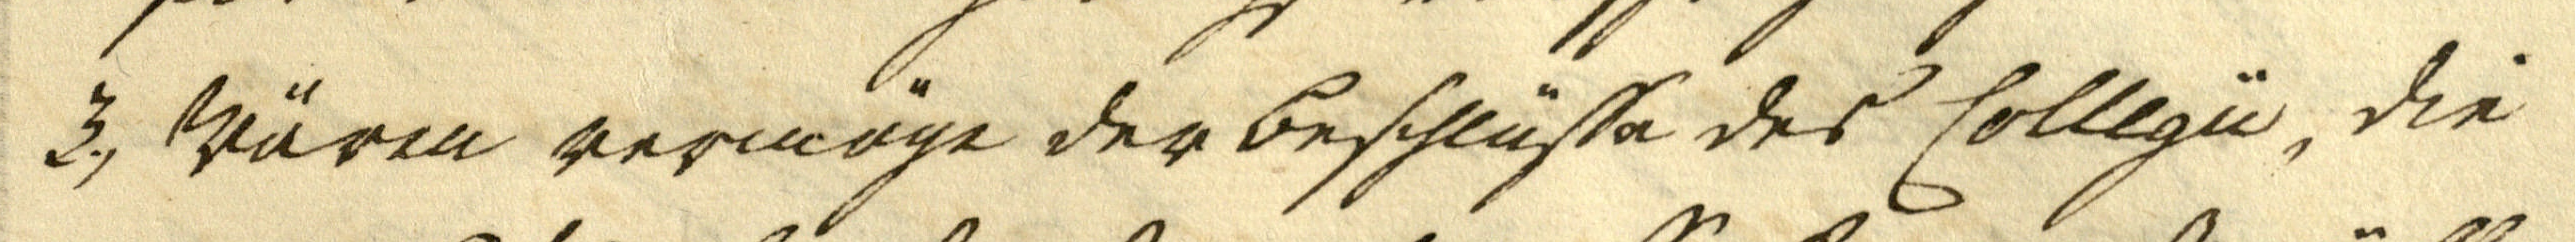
3, Wären vermöge der Beschlüsse des Collegii, die
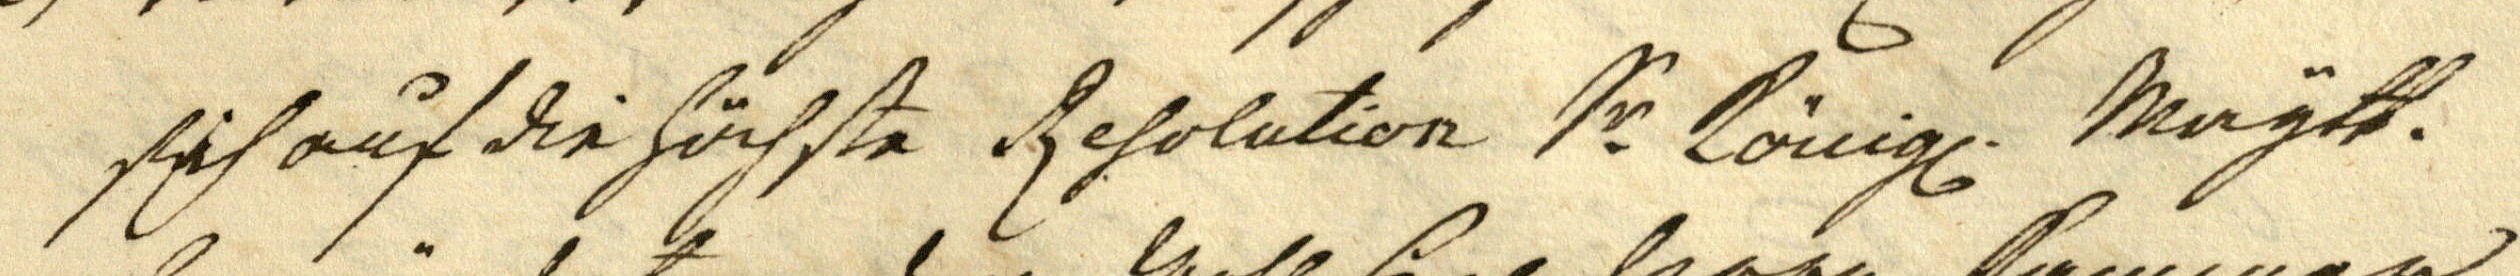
sich auf die Höchste Resolution Sr Königl. Maÿtt.
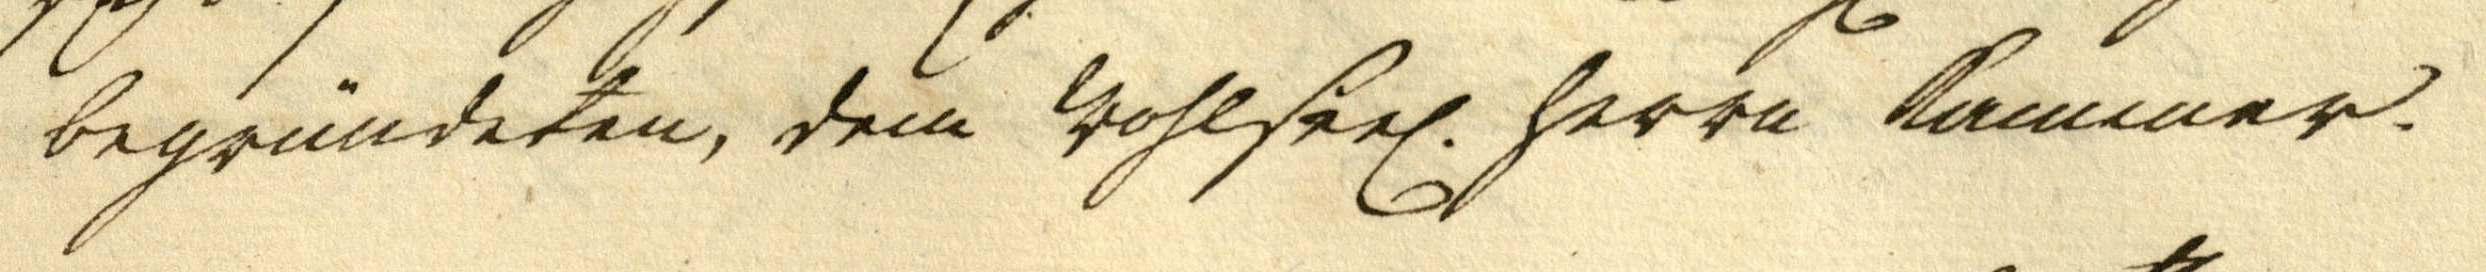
begründeten, dem Wohlseel. Herrn Kammer¬
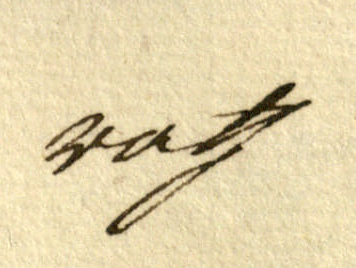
rath
